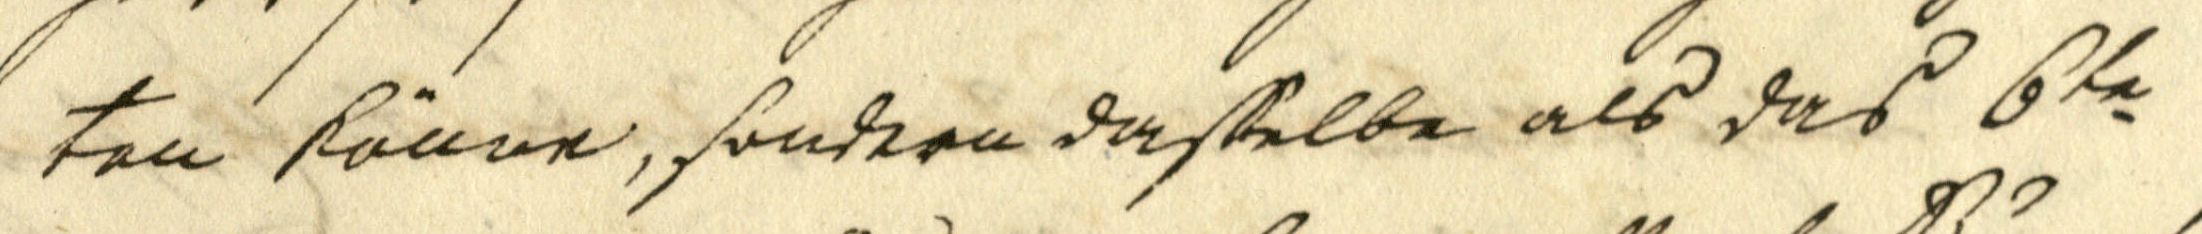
ten könne, sondern dasselbe als das 6 te
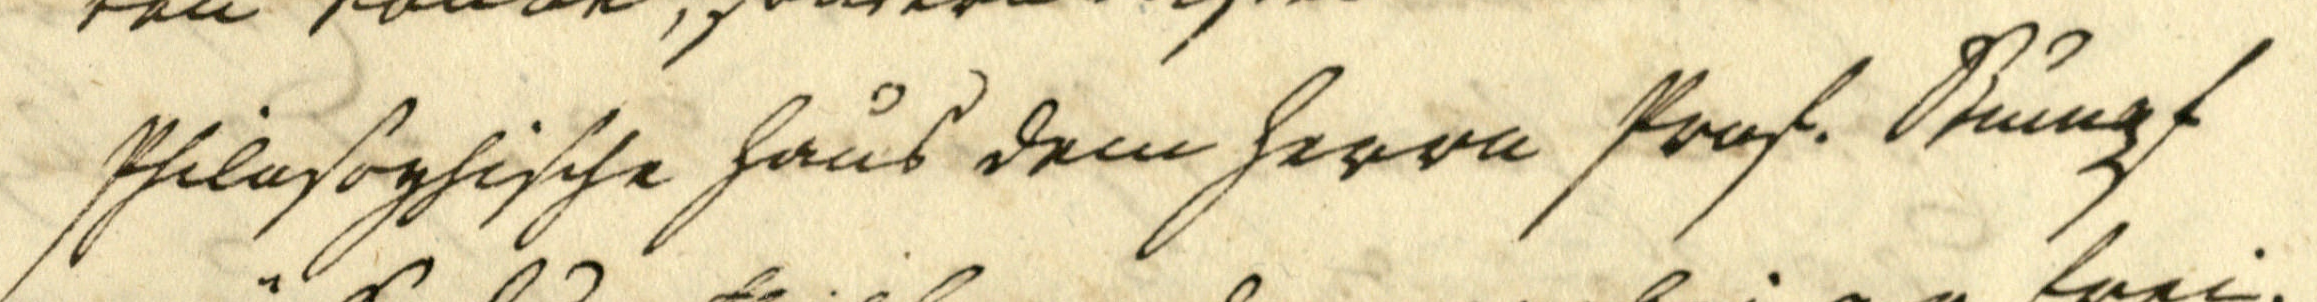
Philosophische Haus dem Herrn Prof. Stumpf
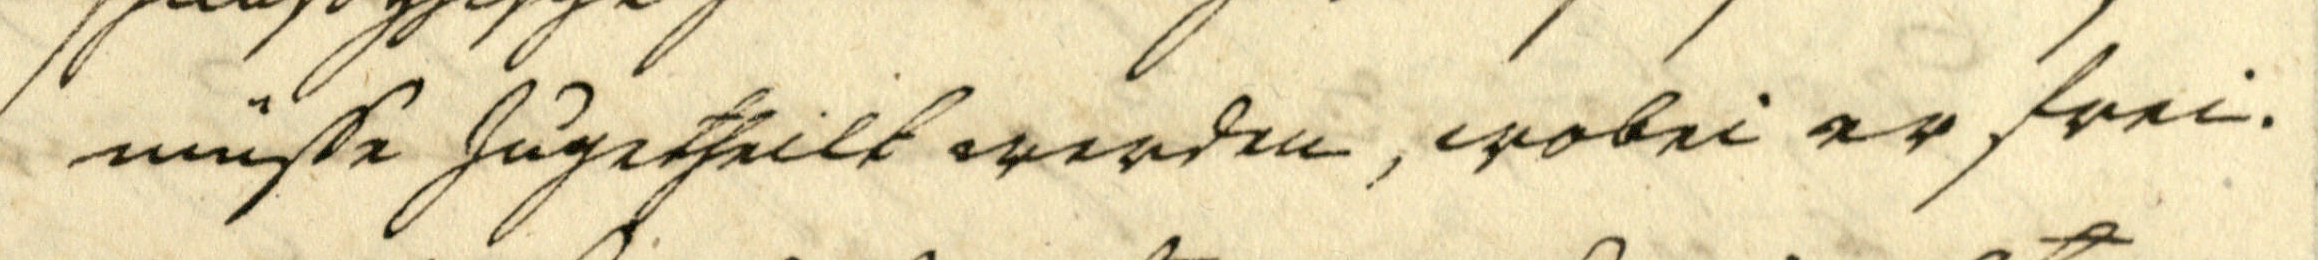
müsse zugetheilt werden, wobei er frei¬
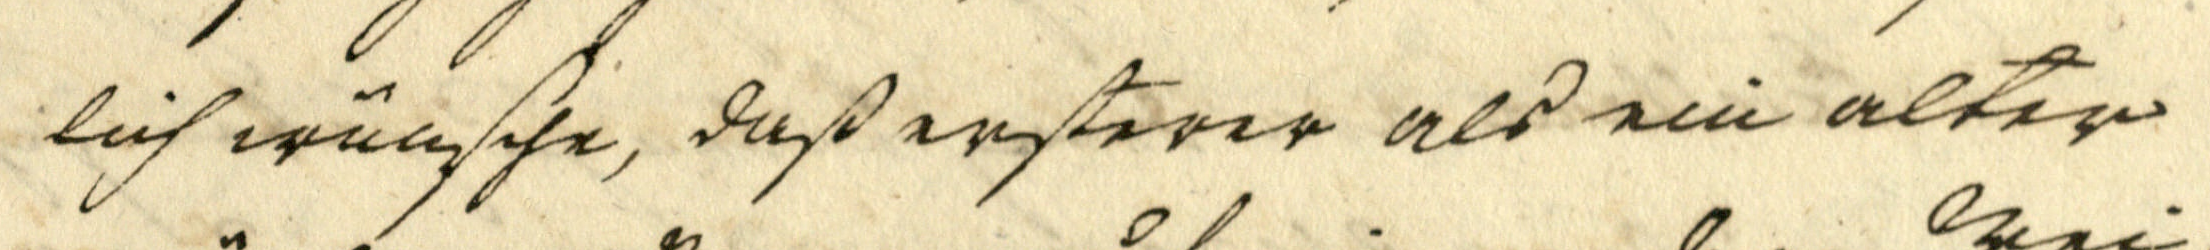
lich wünsche, daß ersterer als ein alter
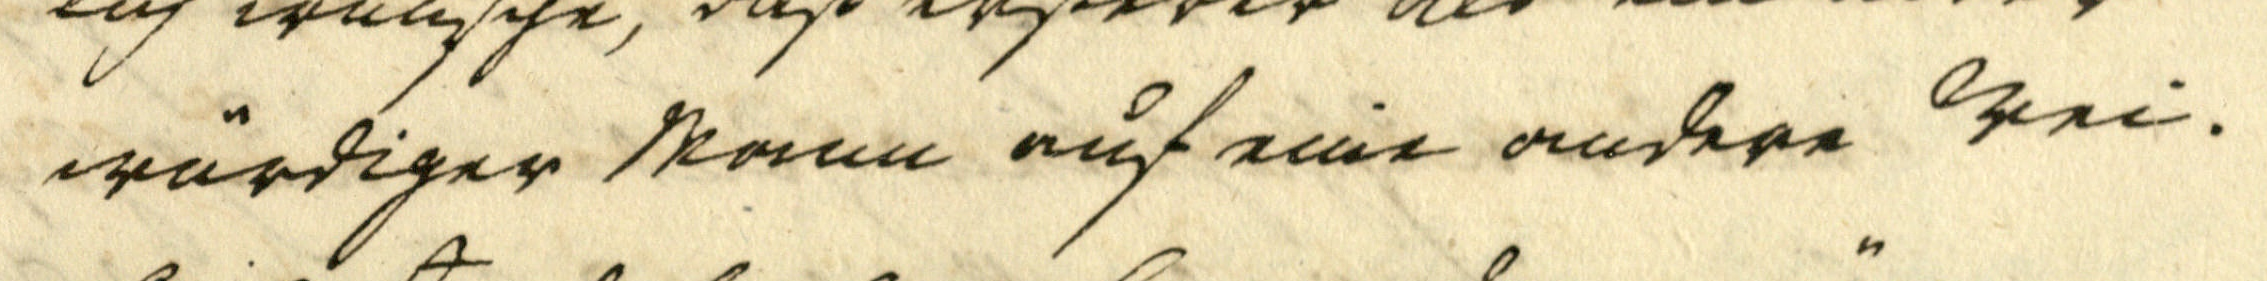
würdiger Mann auf eine andere Wei¬
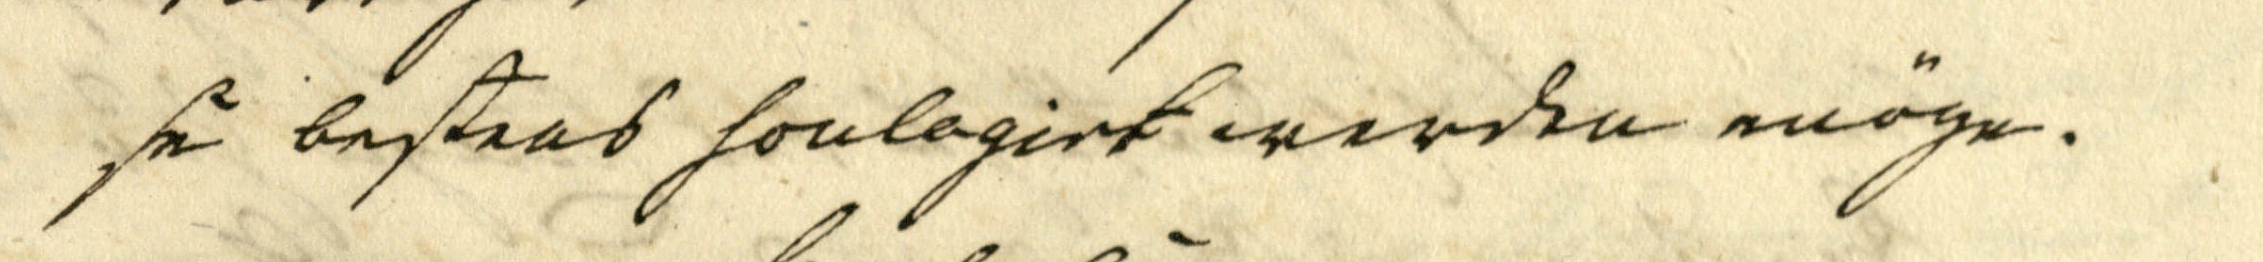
se bestens soulagirt werden möge.
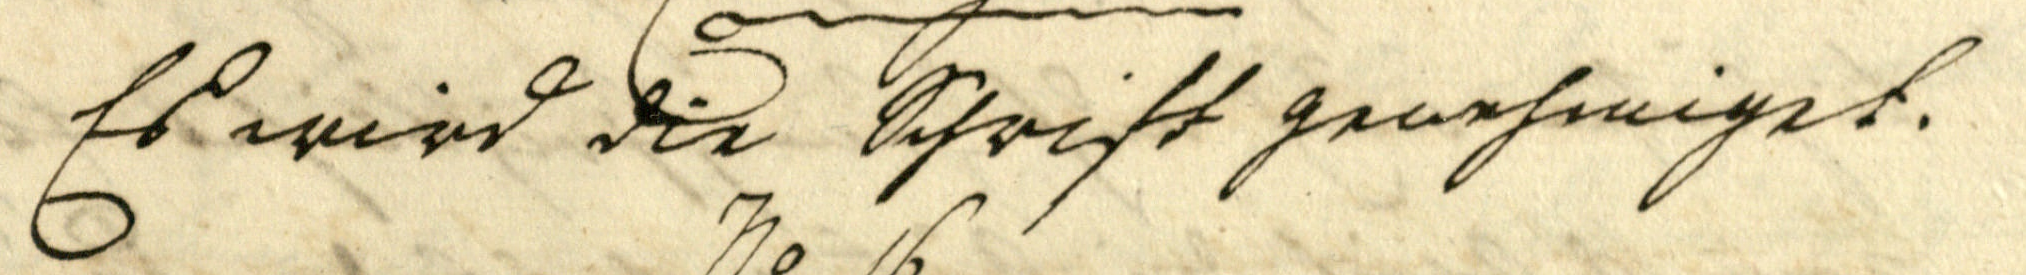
Es wird die Schrift genehmiget.
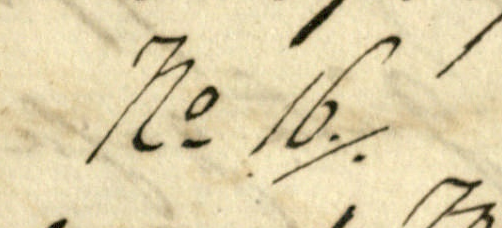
No 16.
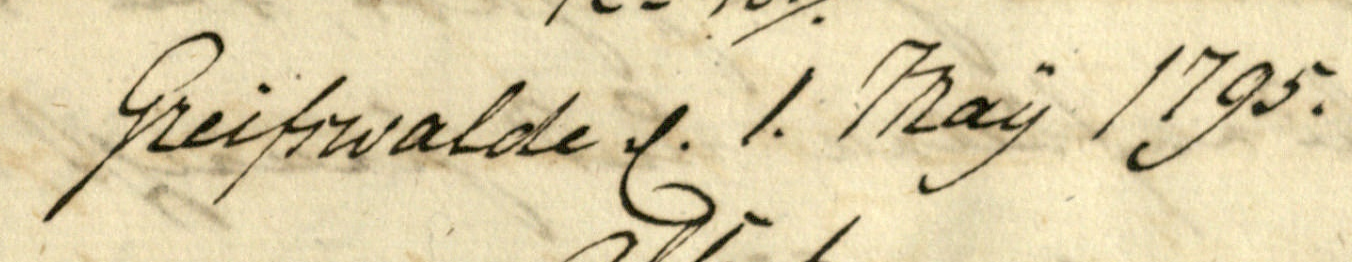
Greifswalde d. 1. Maÿ 1795.
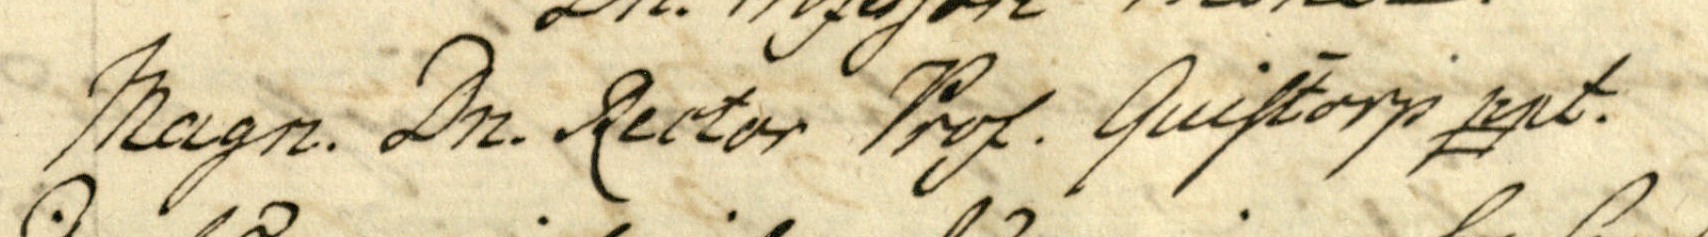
Magn. Dn. Rector Prof. Quistorp ppt.
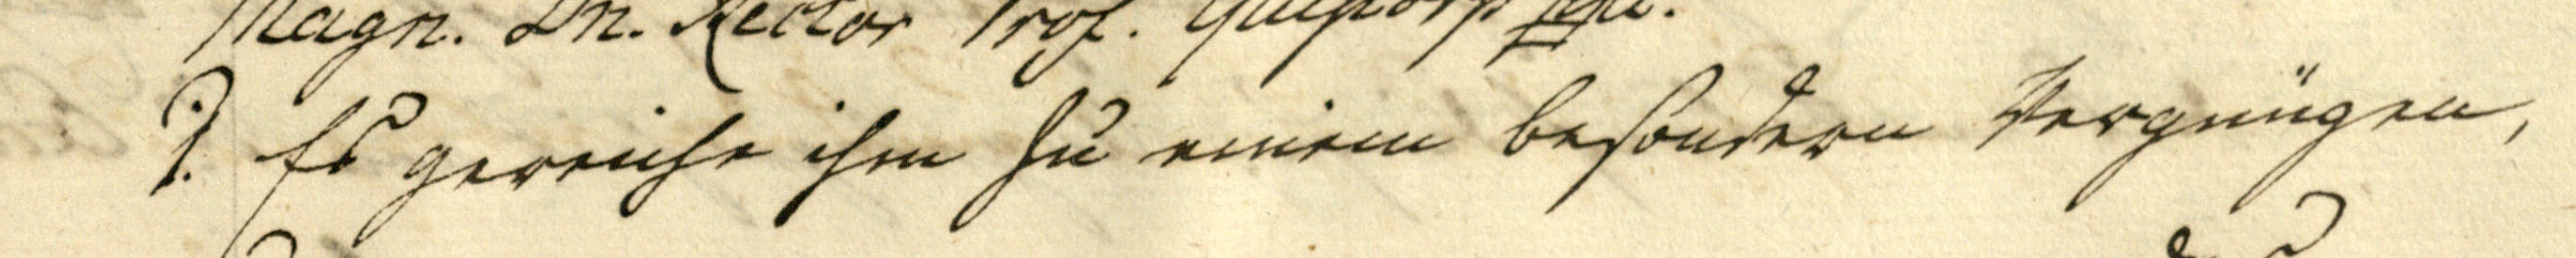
1. Es gereiche ihm zu einem besondern Vergnügen,
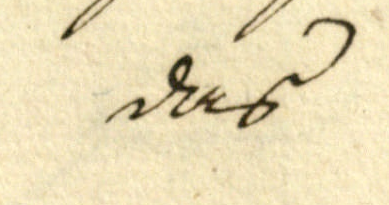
das
